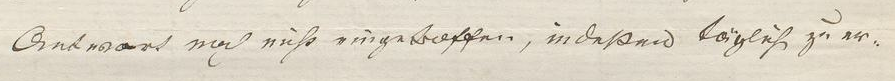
Antwort noch nicht eingetroffen, indeßen täglich zu er-
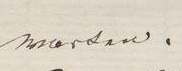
warten.
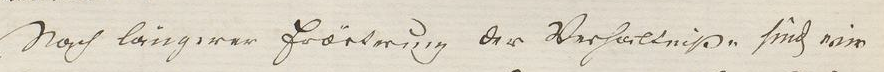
Nach längerer Erörterung der Verhältniße sind wir
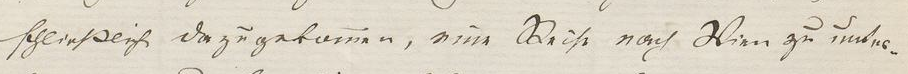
schließlich dazugekommen, eine Reise nach Wien zu unter-
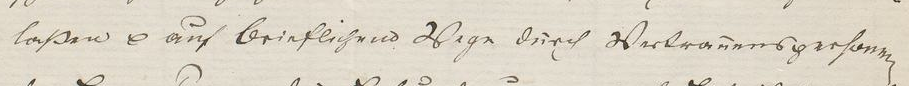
laßen & auf brieflichem Wege durch Vertrauenspersonen
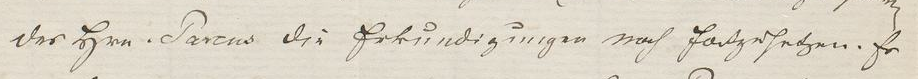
des Hrn. Parcus die Erkundigungen noch fortzusetzen. Es
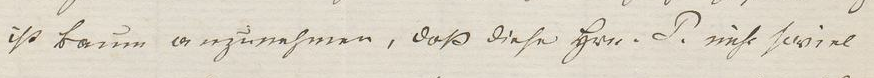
ist kaum anzunehmen, daß diese Hrn. P. nicht soviel
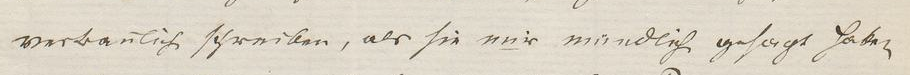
vertraulich schreiben, als sie mir mündlich gesgt haben
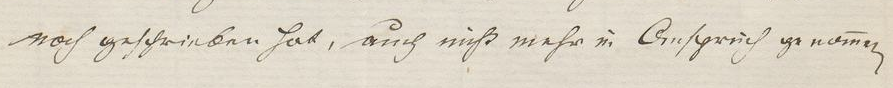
noch geschrieben hat, auch nicht mehr in Anspruch genommen
